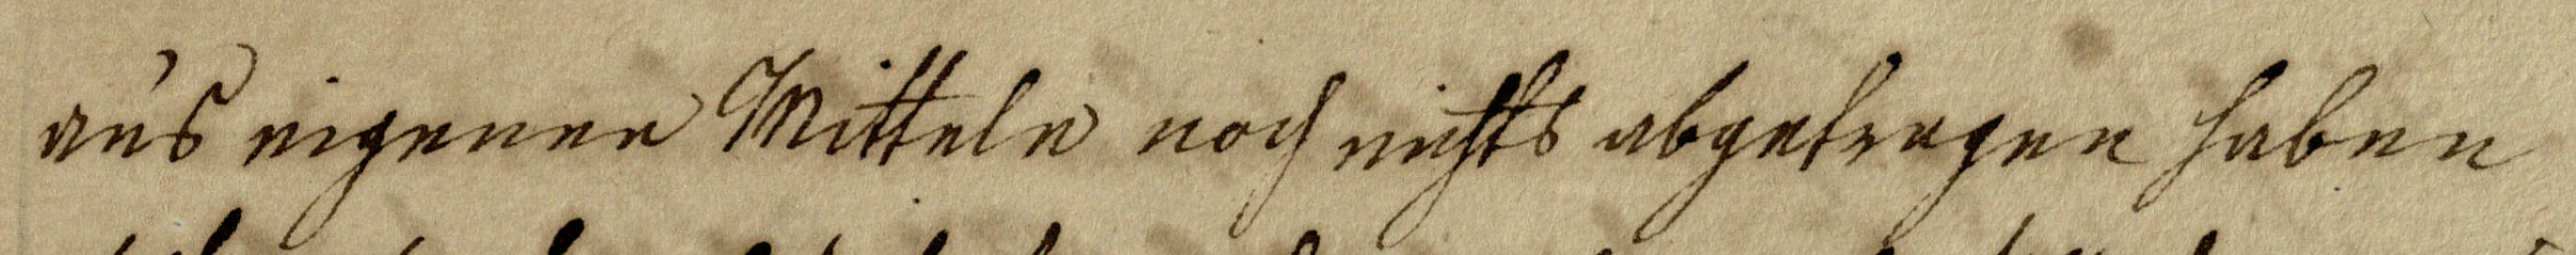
aus eigenen Mitteln noch nichts abgetragen haben
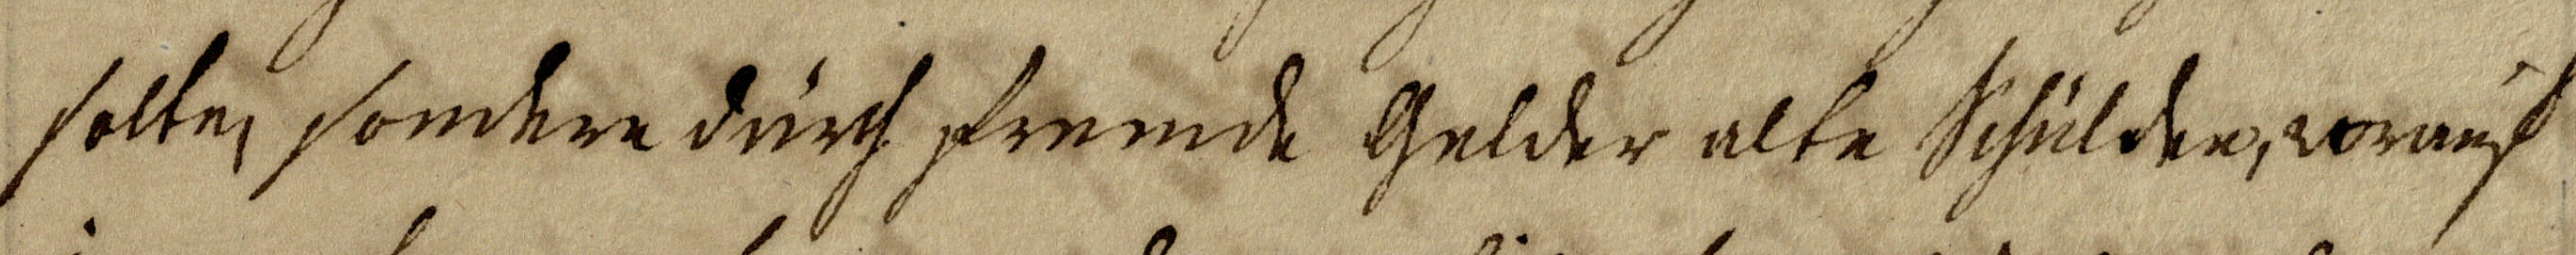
solte, sondern durch fremde Gelder alte Schulden, worauf
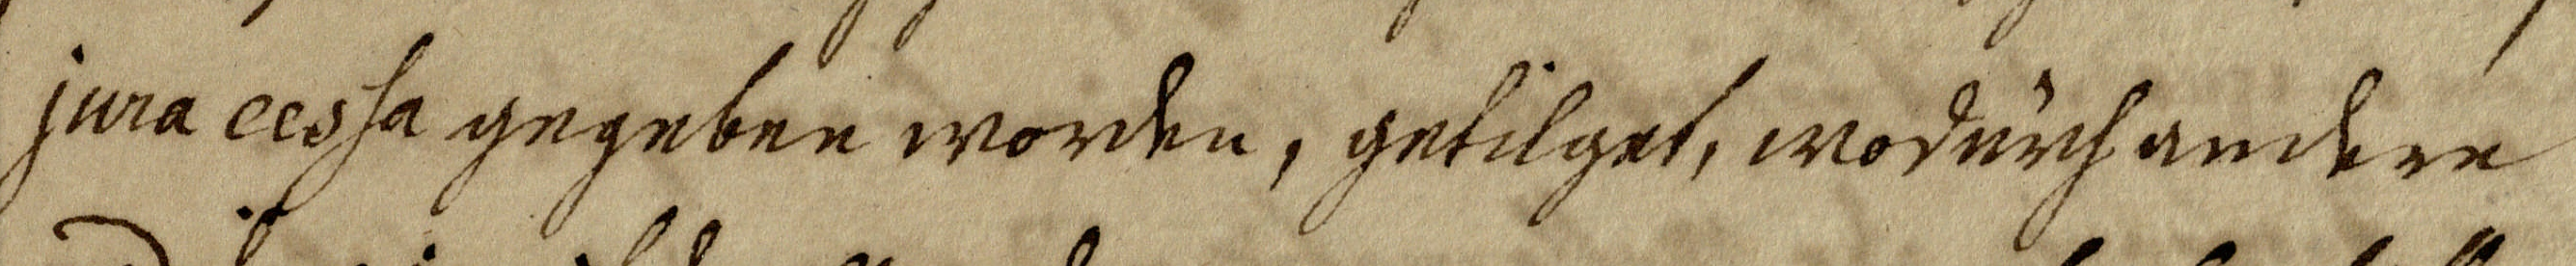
jura cessa gegeben worden, getilget, wodurch andere
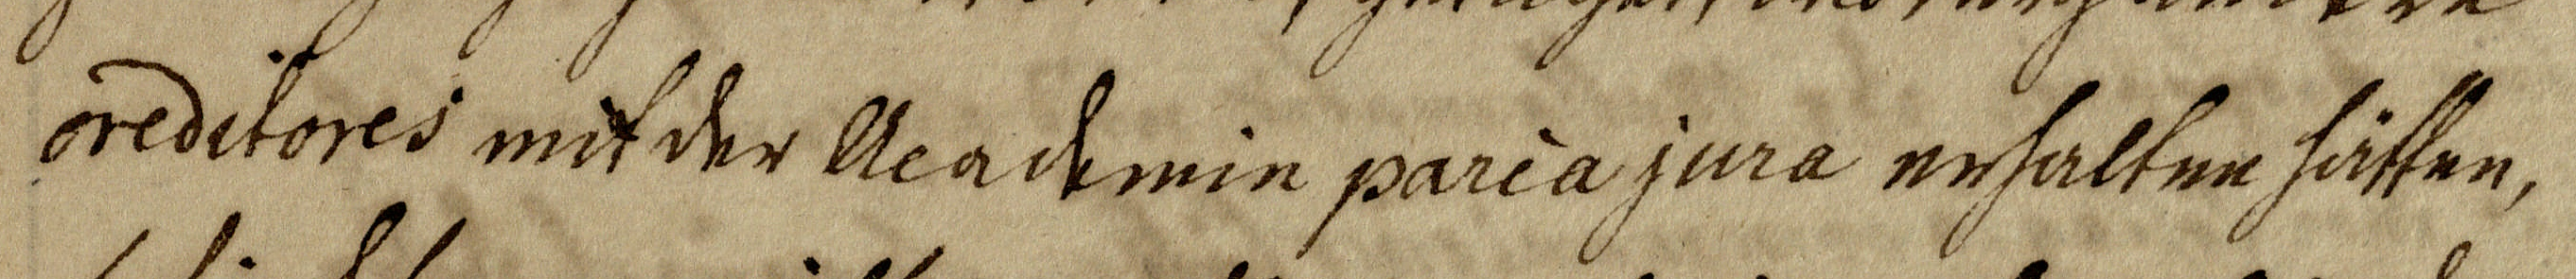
creditores mit der Academie paria jura erhalten hätten,
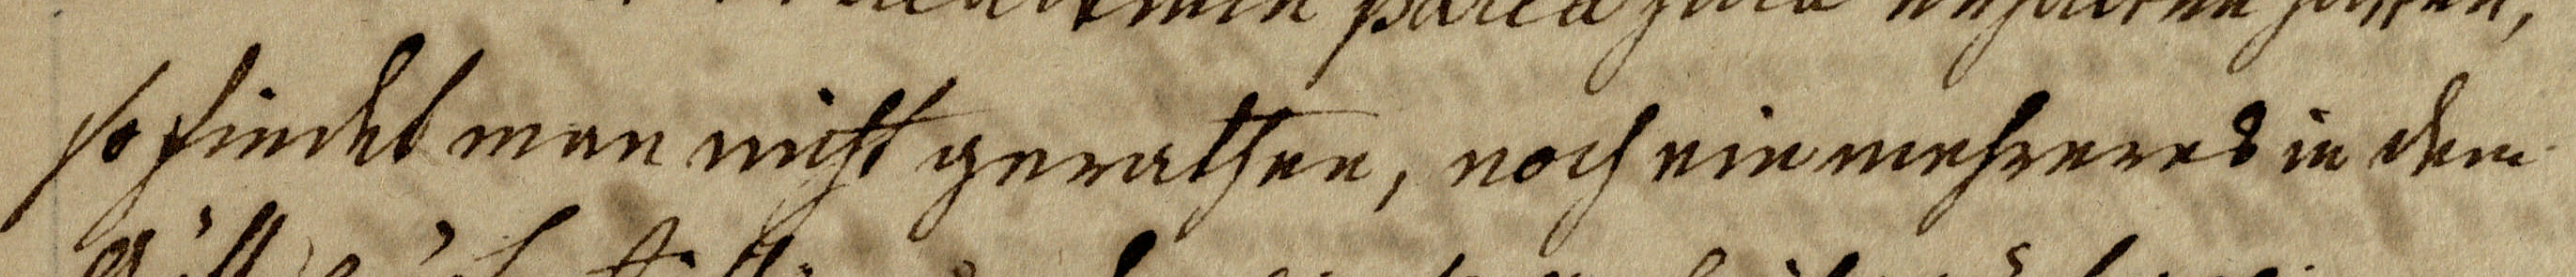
so findet man nicht gerathen noch ein mehreres in dem
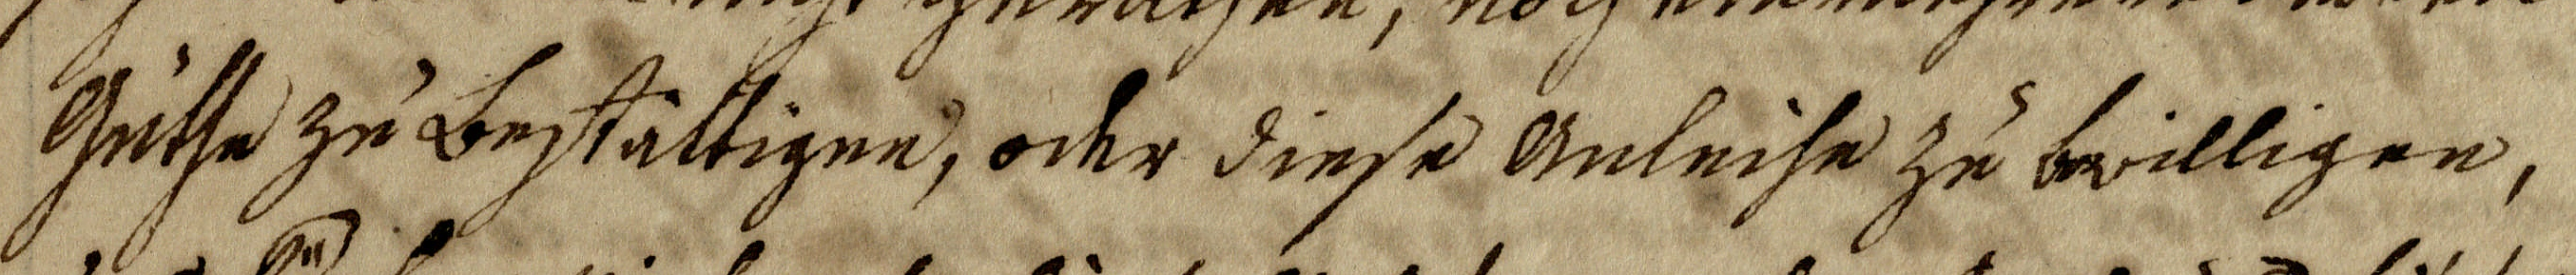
Guthe zu bestättigen, oder diese Anleihe zu bewilligen,
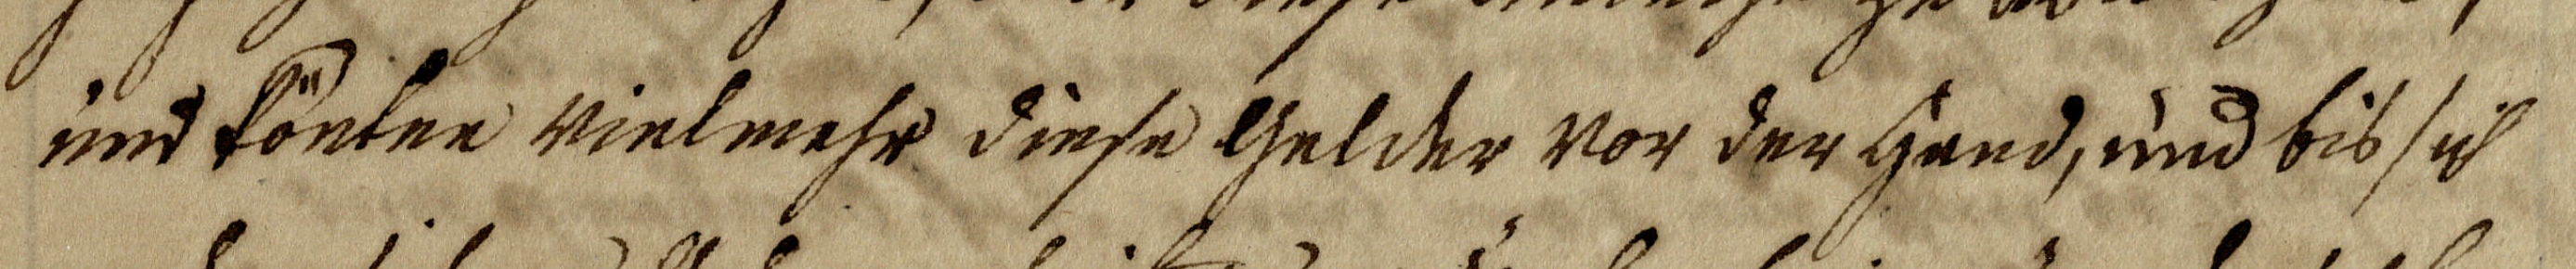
und könten vielmehr diese Gelder vor der Hand, und bis sich
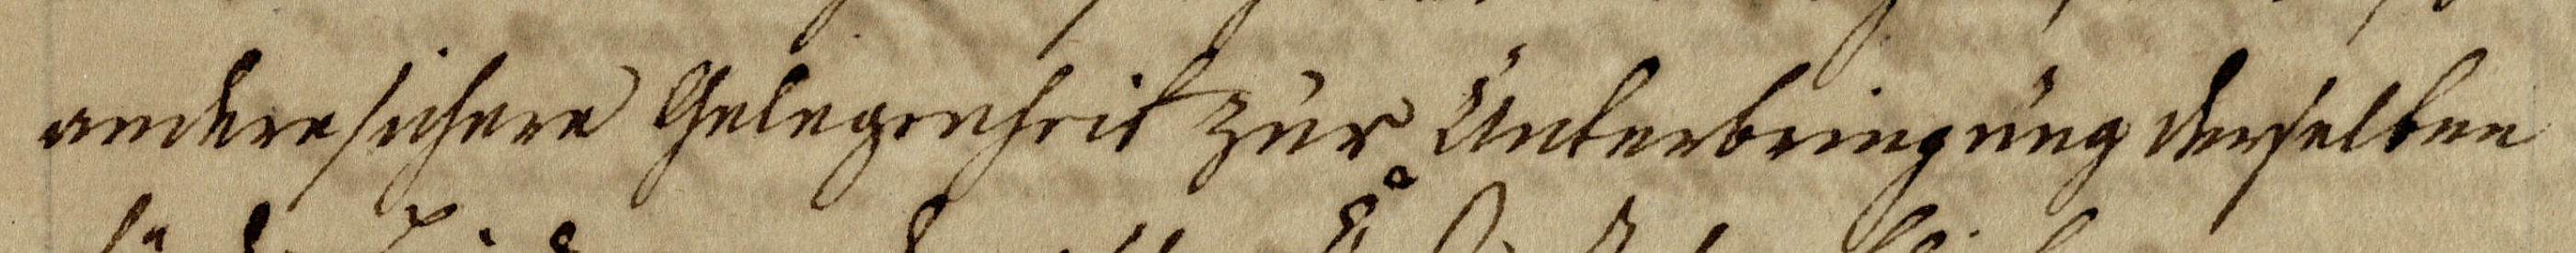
andere sichere Gelegenheit zur Unterbringung derselben
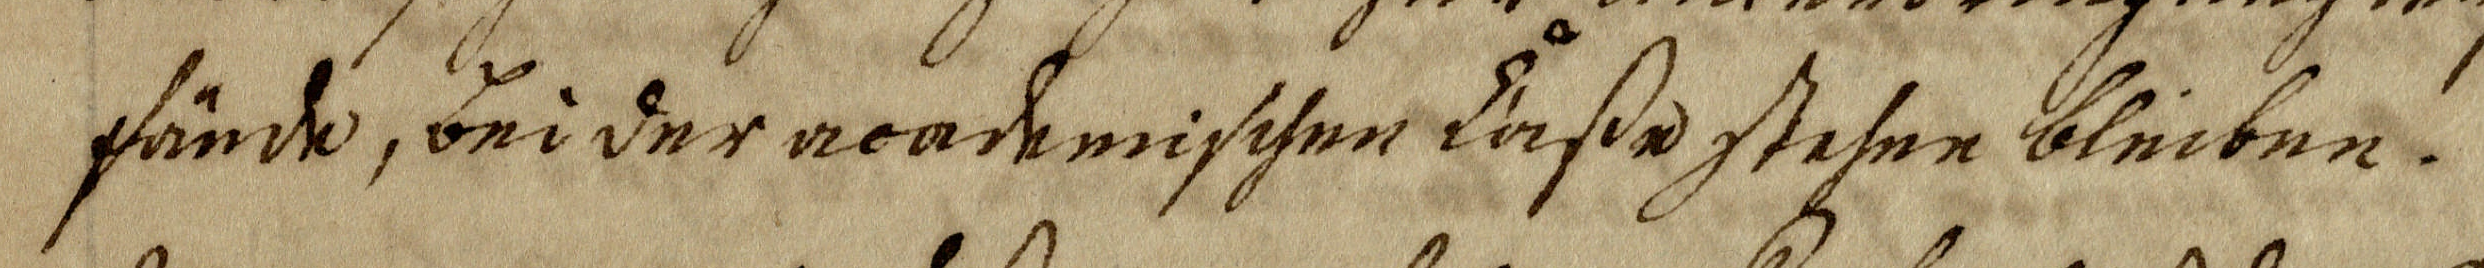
fände, bei der academischen Caße stehen bleiben.
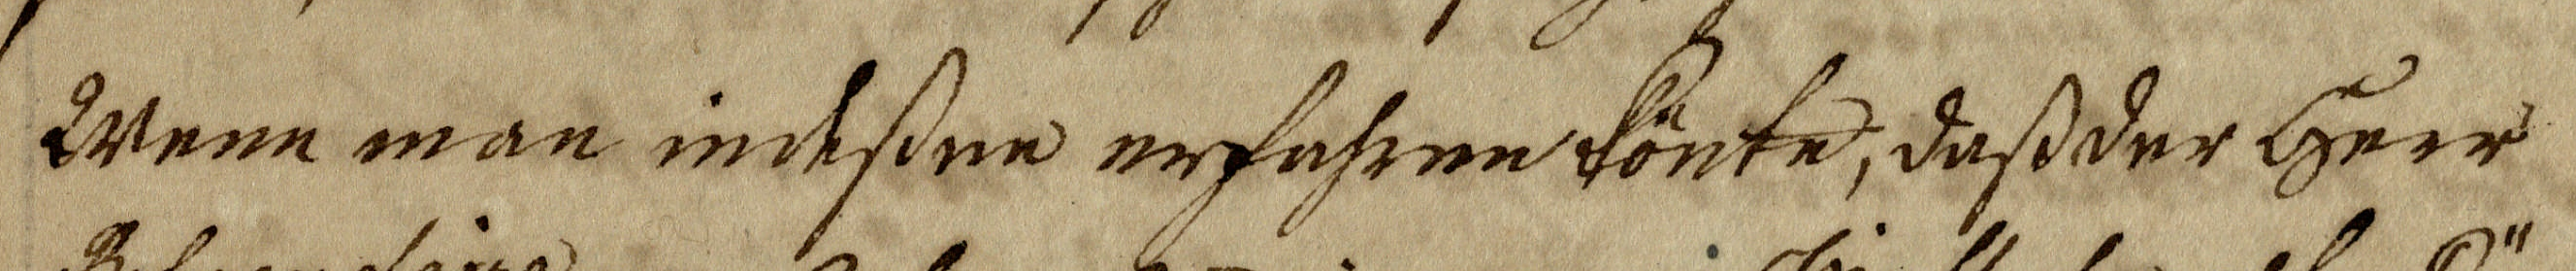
Wenn man indeßen erfahren könnte, daß der Herr
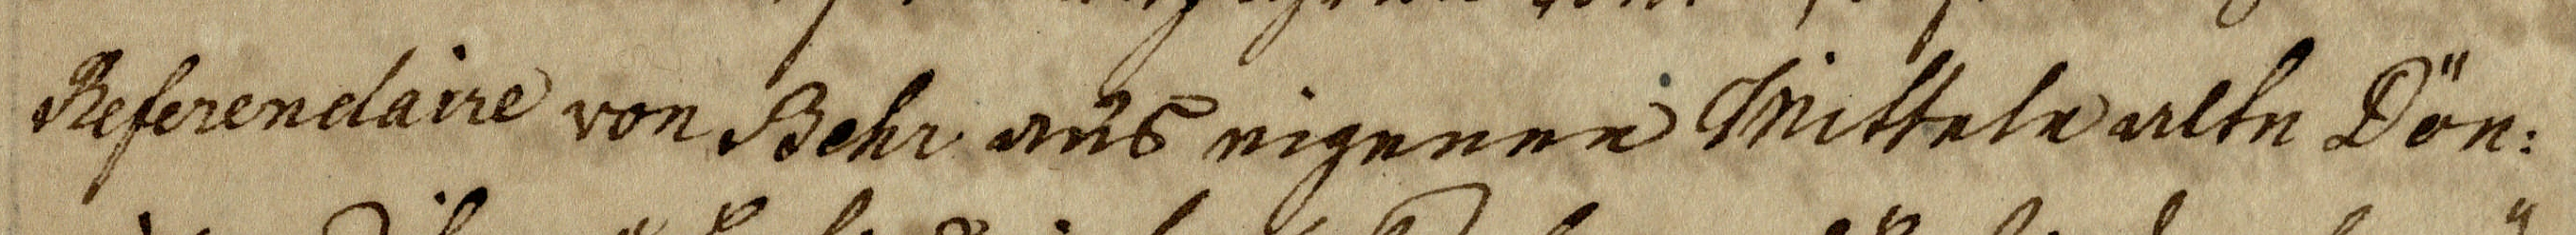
Referendaire von Behr aus eigenen Mitteln alte Dön¬
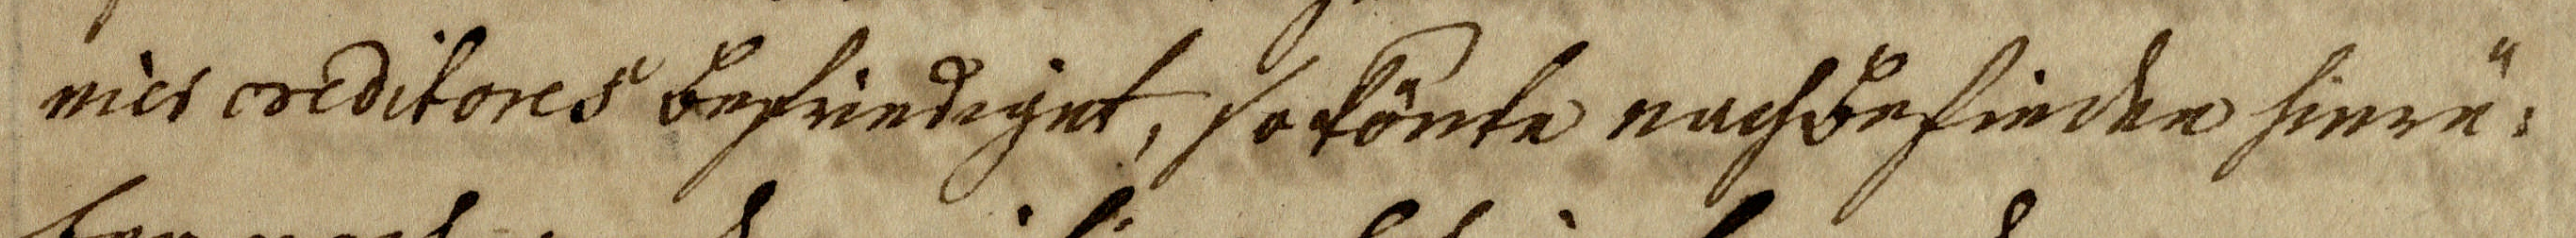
nis creditores befriediget, so könte nach befinden hierü¬
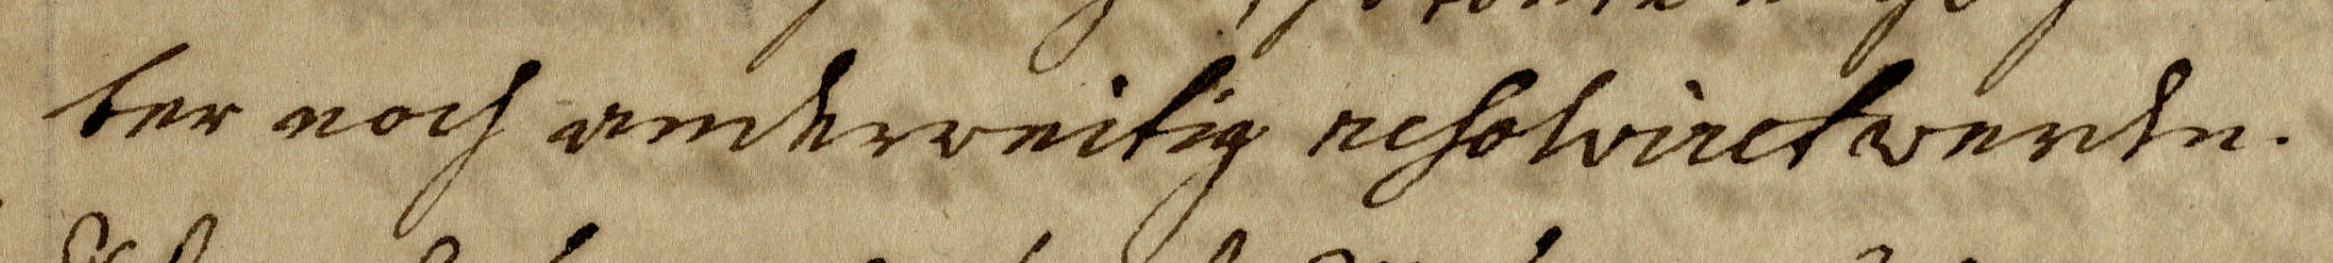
ber noch anderweitig resolviret werden.
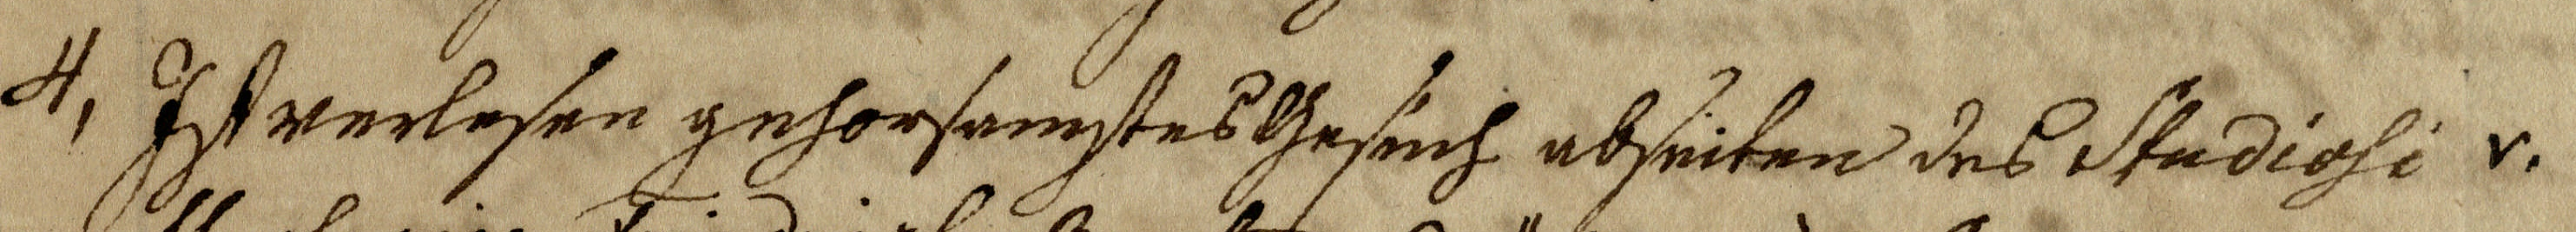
4, Ist verlesen gehorsamstes Gesuch abseiten des Studiosi v.
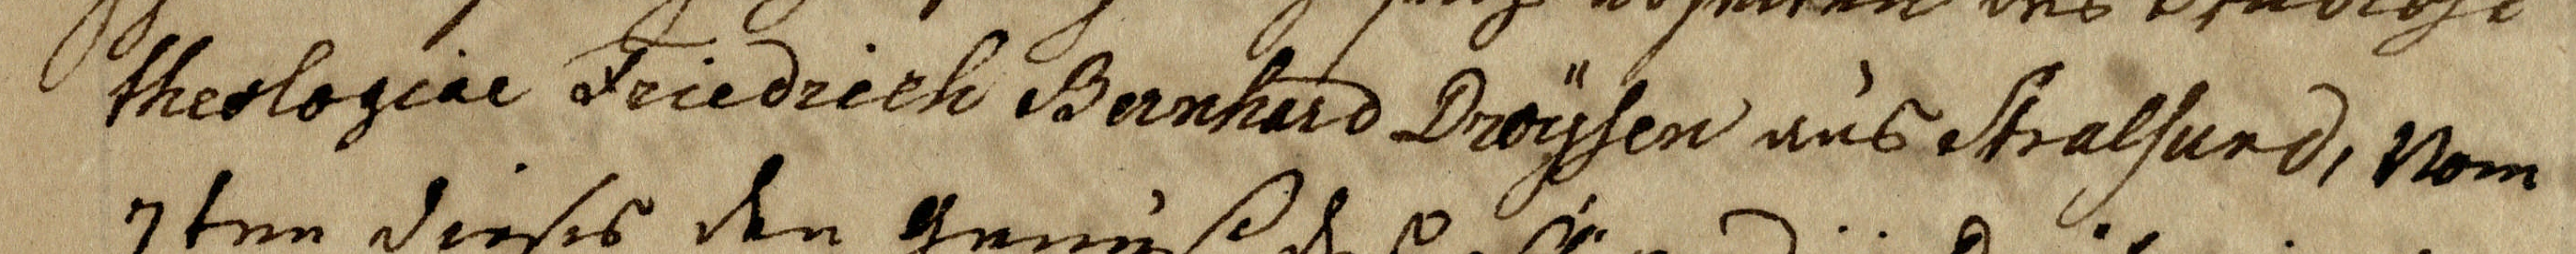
theologiae Friedrich Bernhard Droÿsen aus Stralsund, vom
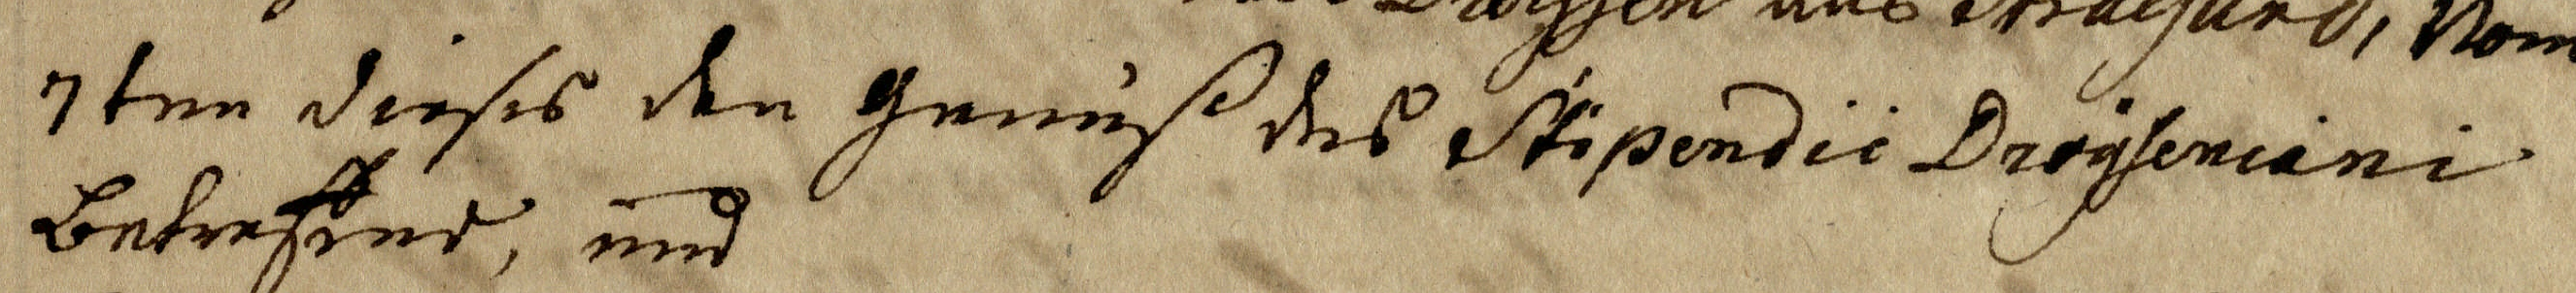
7 ten dieses den Genuß des Stipendii Droÿseniani
